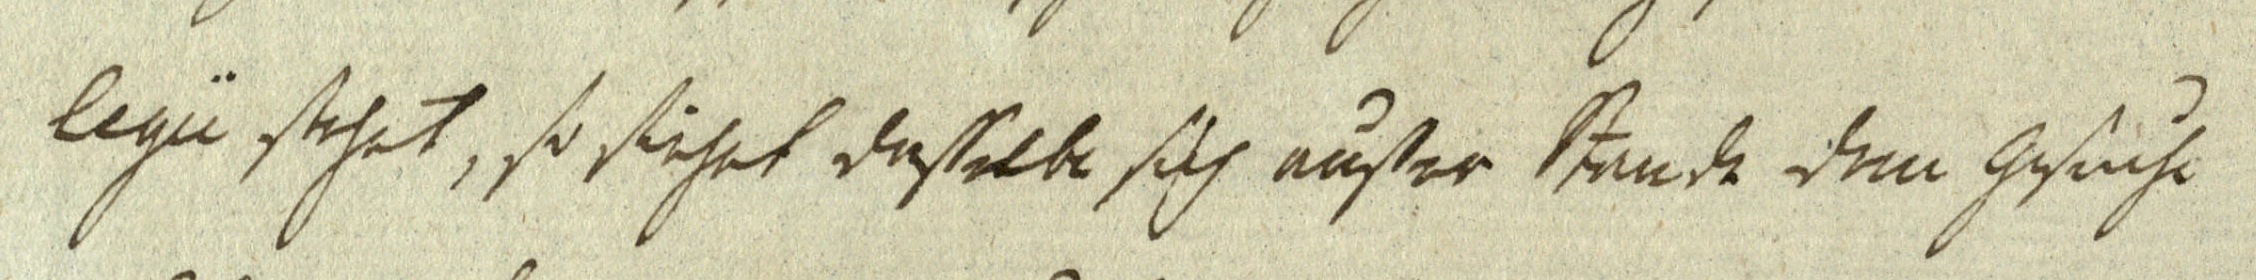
legii stehet, so siehet dasselbe sich außer Stande dem Gesuche
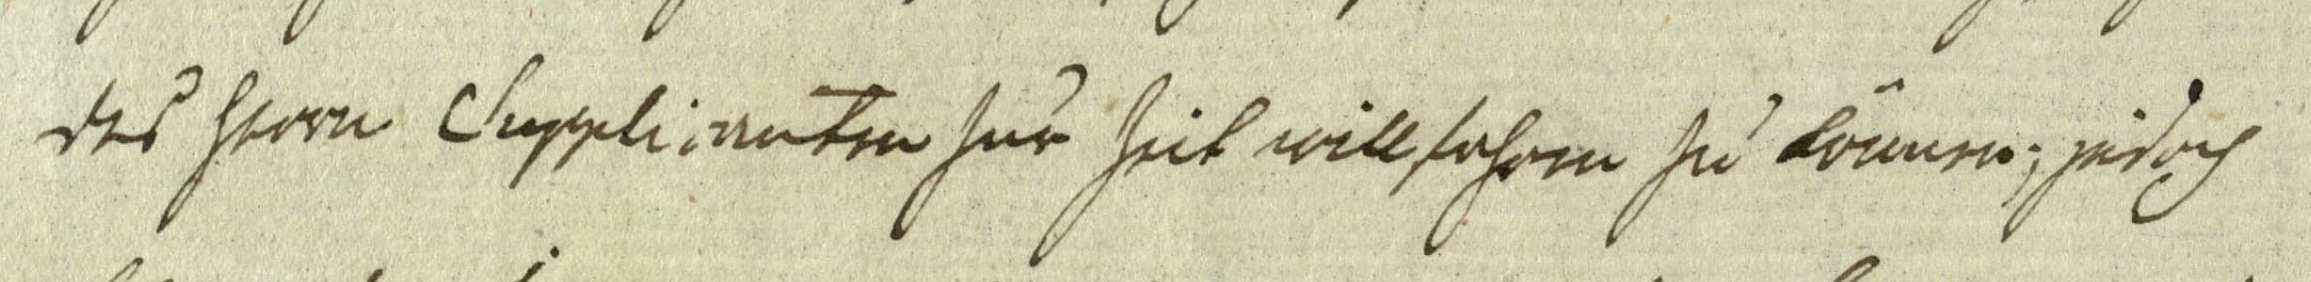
des Herrn Supplicanten zur Zeit willfahren zu können; jedoch
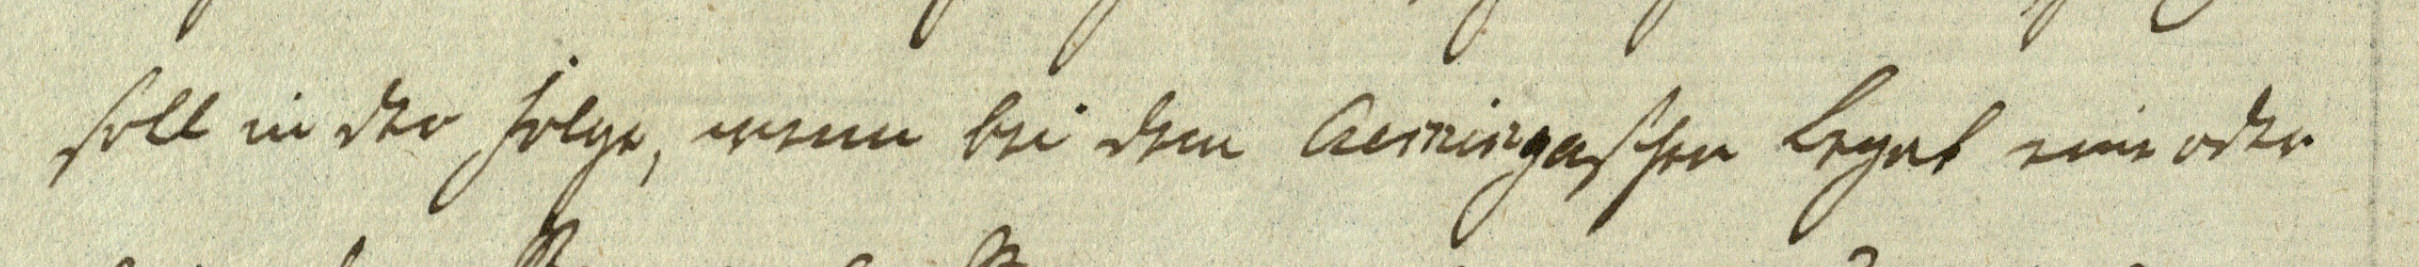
soll in der Folge, wenn bei dem Aemingaschen Legat eine oder
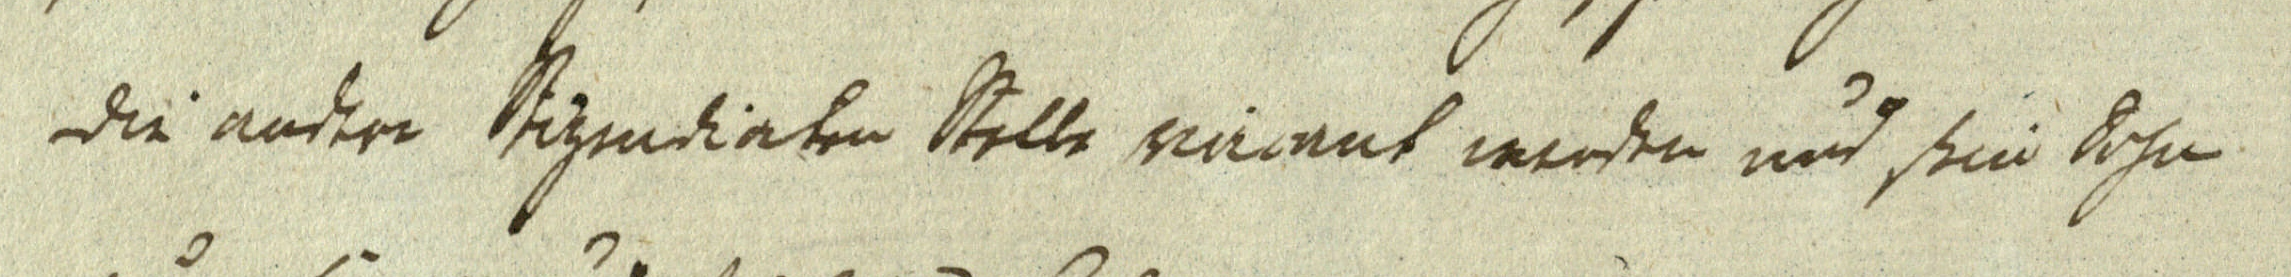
die andere Stipendiaten Stelle vacant werden und sein Sohn
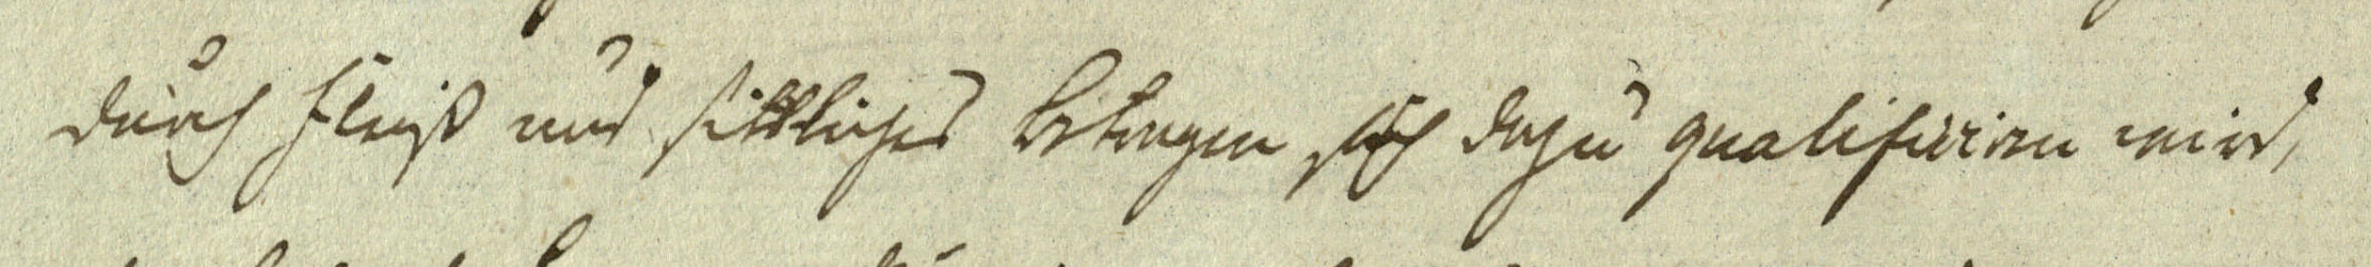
durch Fleiß und sittliches Betragen sich dazu qualificiren wird,
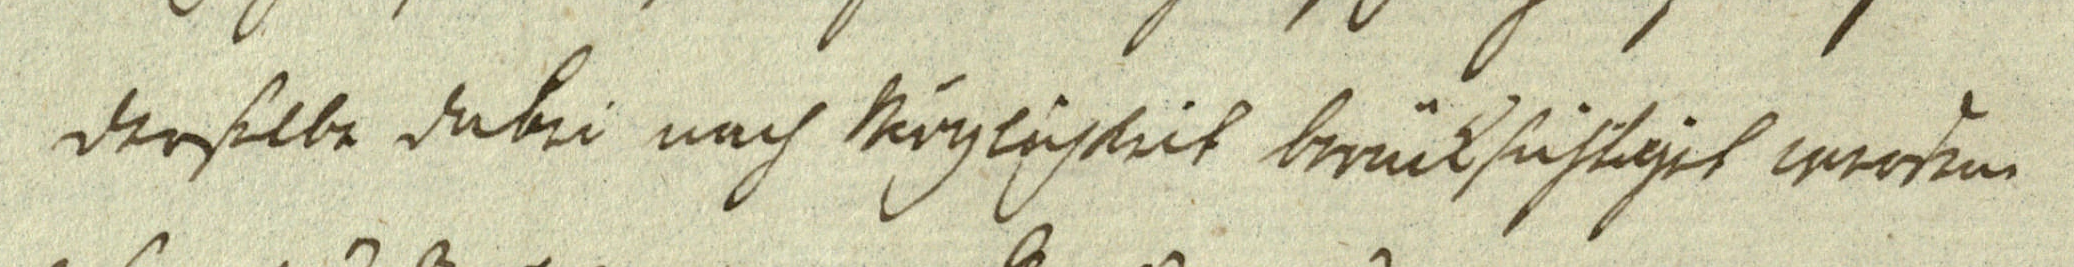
derselbe dabei nach Möglichkeit berücksichtiget werden.
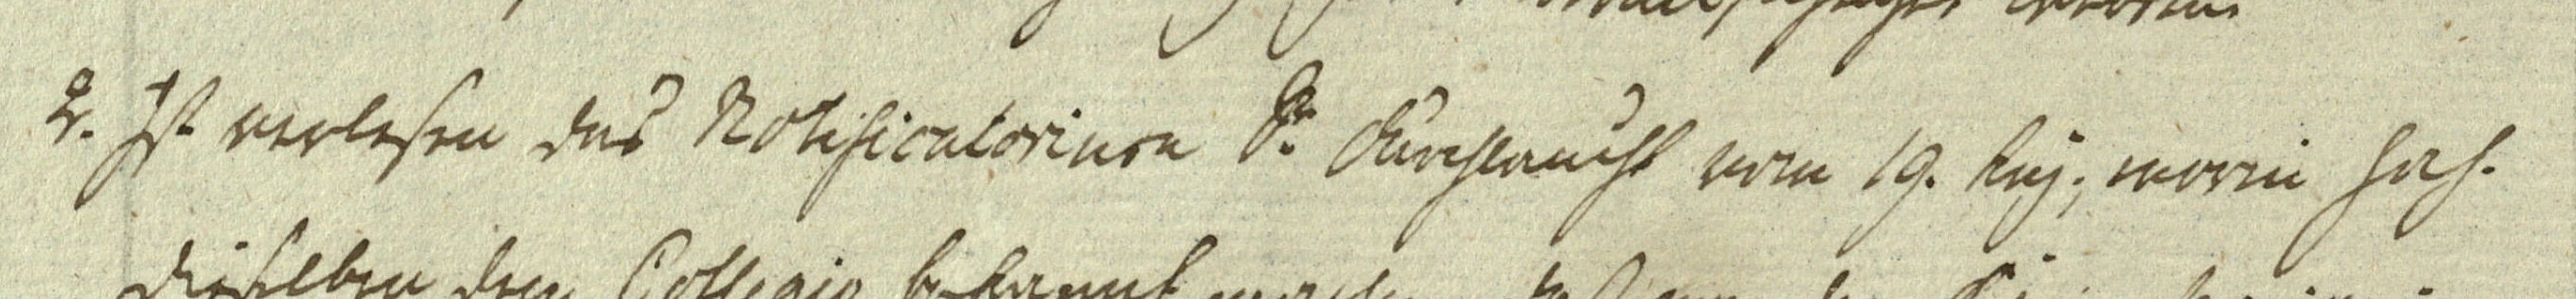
2. Ist verlesen das Notificatorium Sr. Durchlaucht vom 19. huj. worin hoch¬
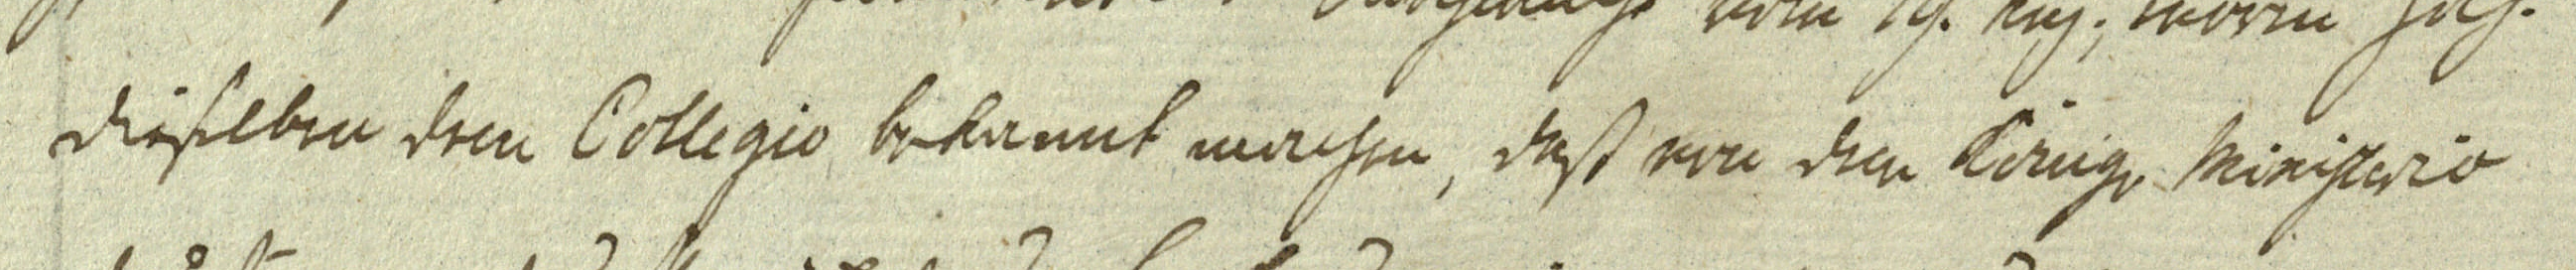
dieselben dem Collegio bekannt machen, daß von dem Königl Ministerio
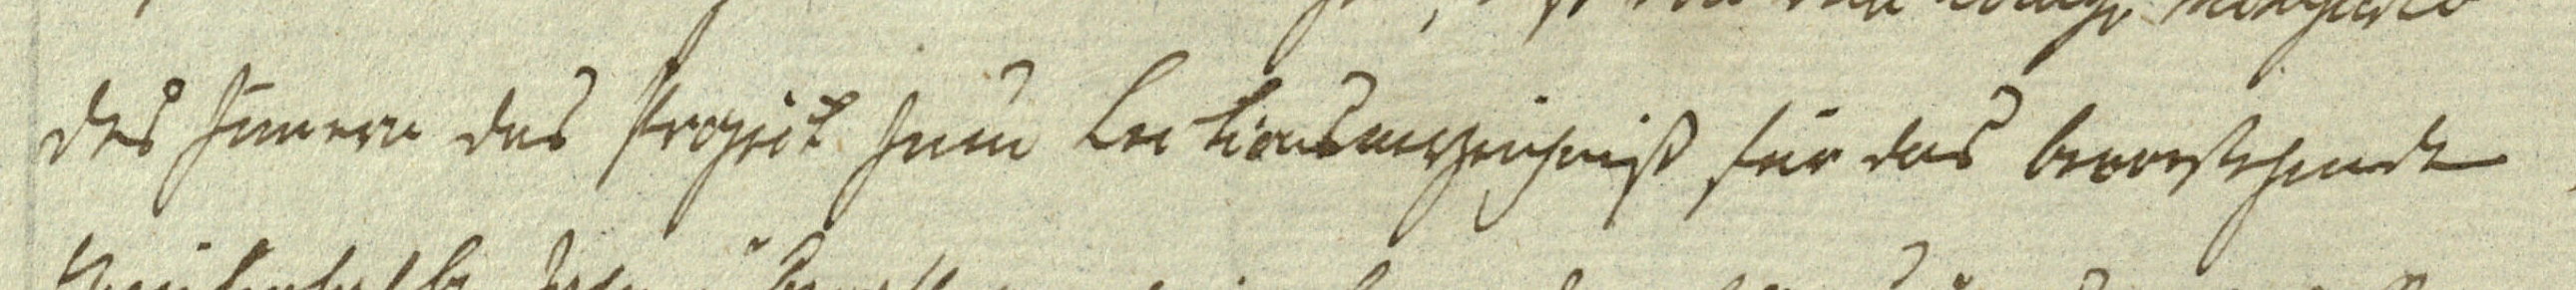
des Innern das Project zum lectionsverzeichniß für das bevorstehende
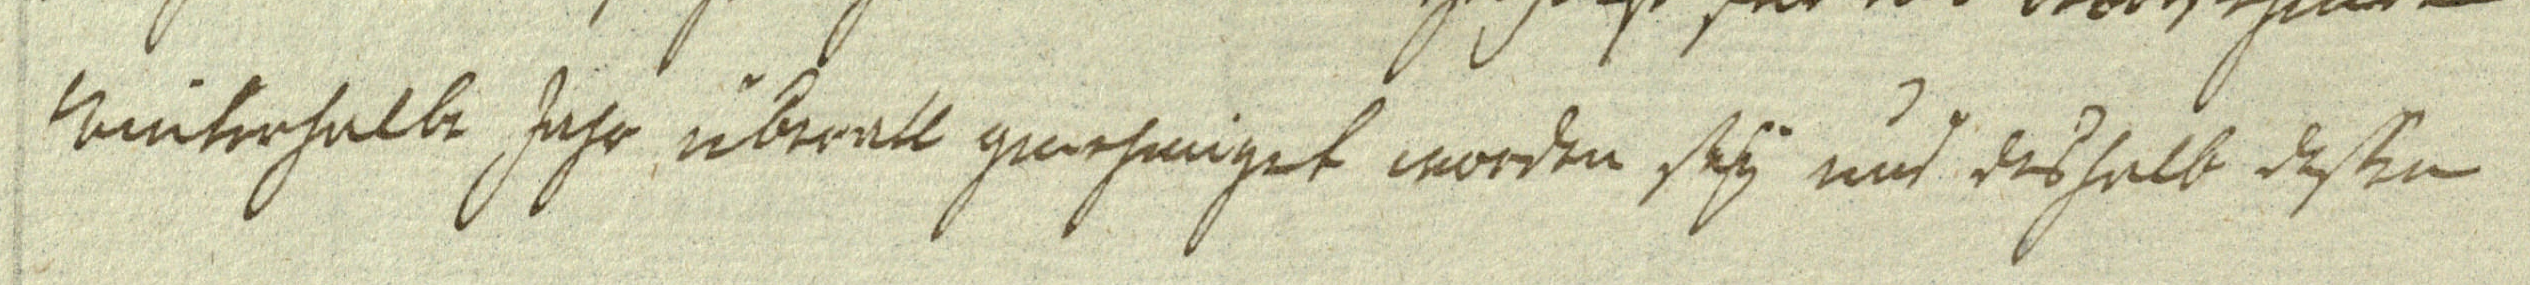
Winterhalbe Jahr überall genehmiget worden seÿ und deshalb dessen
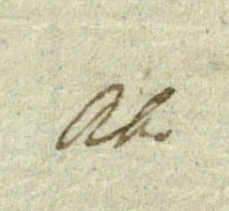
Ab
